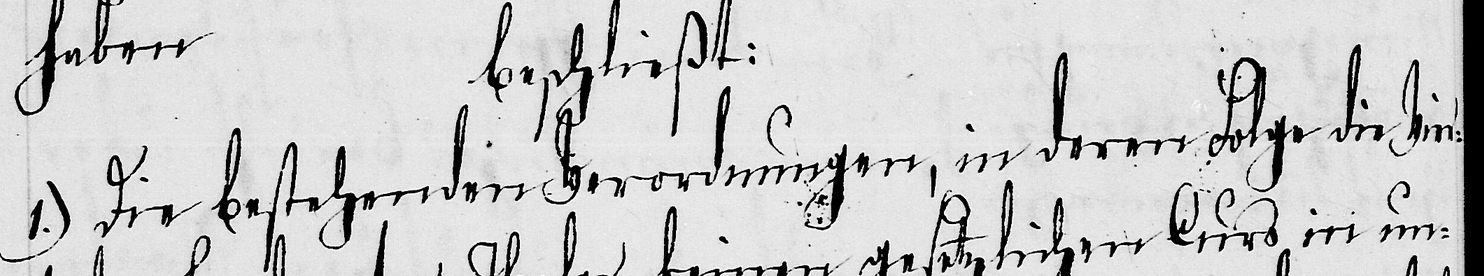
1.) Die bestehenden Verordnungen, in deren Folge die Vie¬
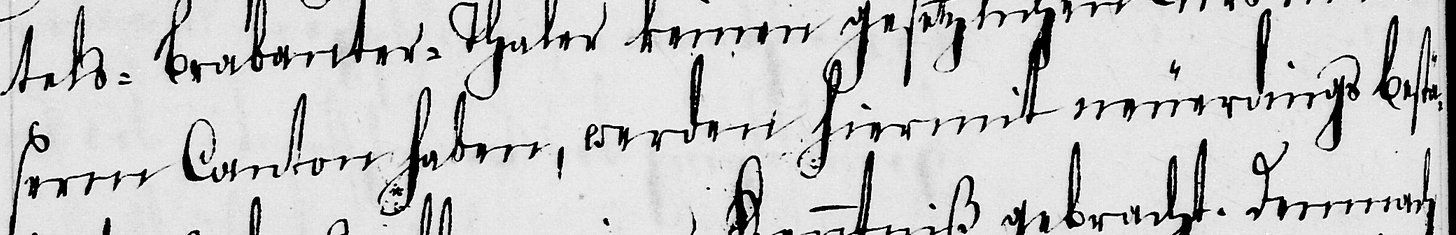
serm Canton haben, werden hiermit neuerdings best¬
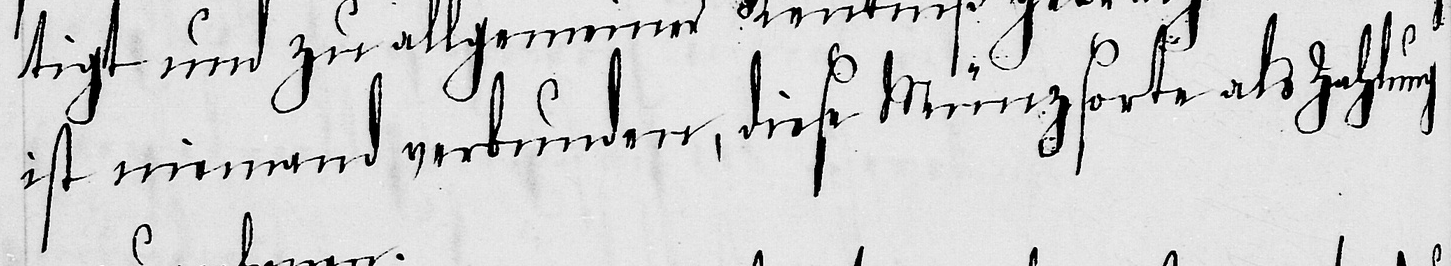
ist niemand verbunden, diese Münzsorte als Zahlung
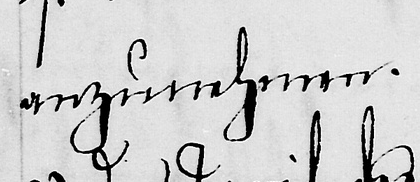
anzunehmen.
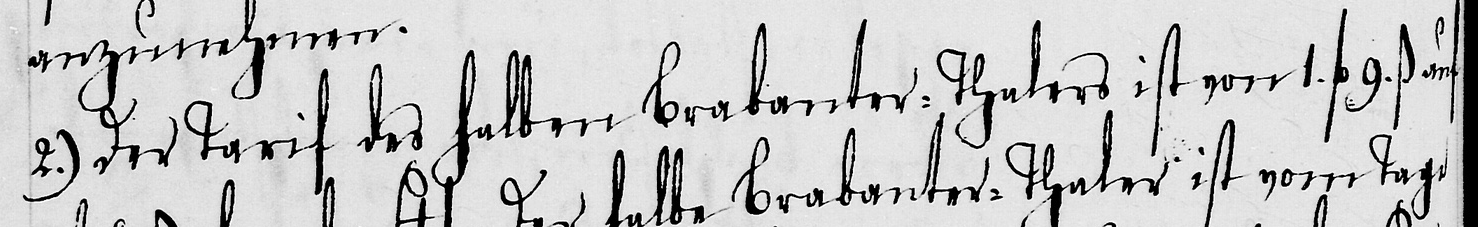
2.) Der Tarif des halben Brabanter-Thalers ist von 1. fl.
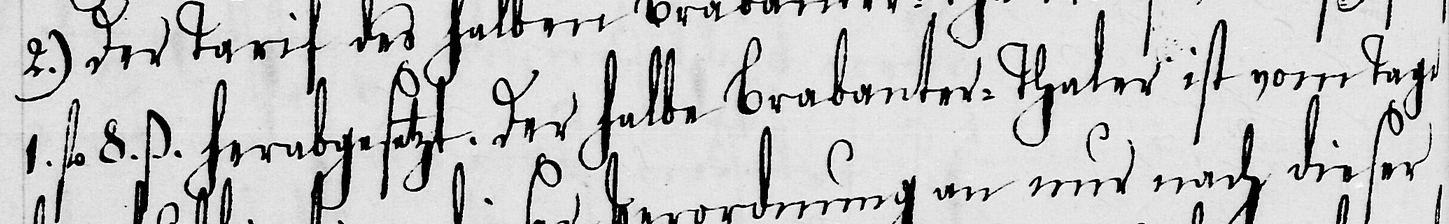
fl. 8. ß herabgesetzt. Der halbe Brabanter-Thaler ist vom Tage
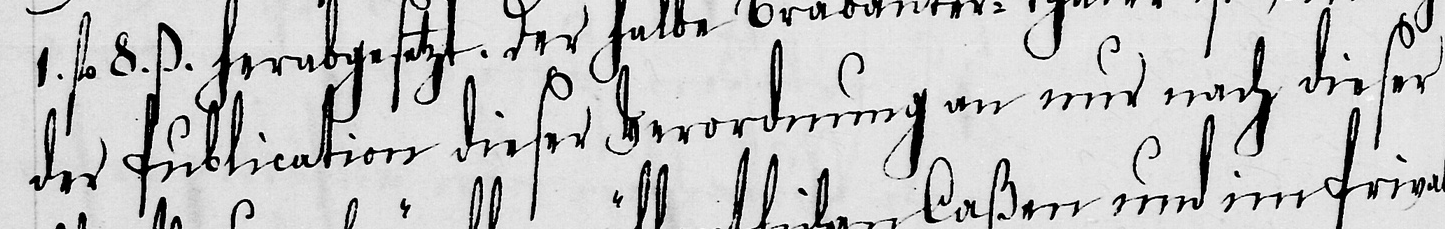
der Publication dieser Verordnung an nur nach dieser
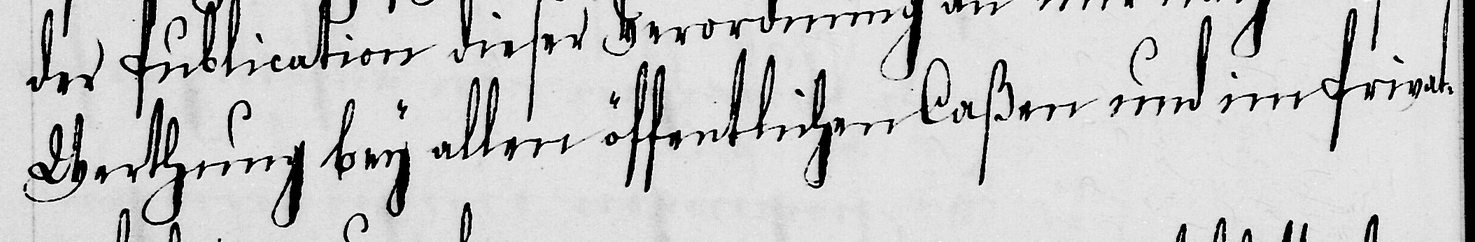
Werthung bey allen öffentlichen Caßen und im Priva¬
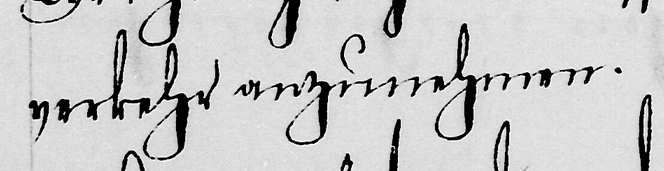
tverkehr anzunehmen.
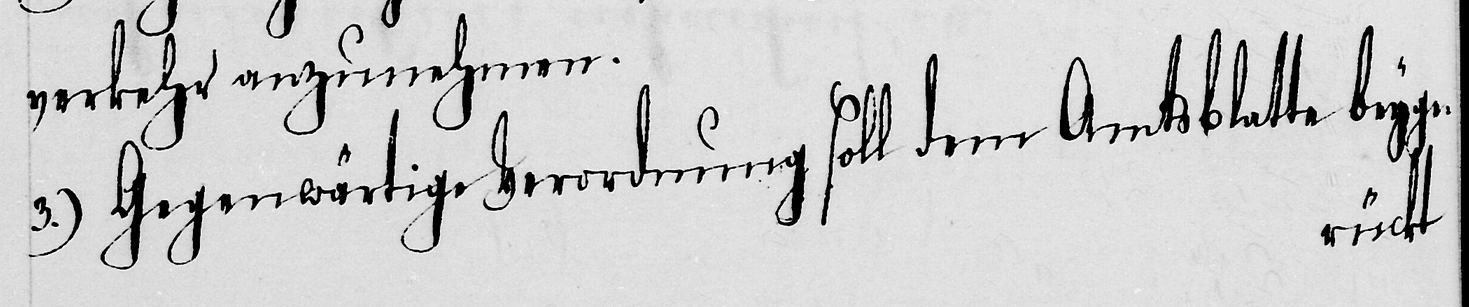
3.) Gegenwärtige Verordnung soll dem Amtsblatte bey¬
